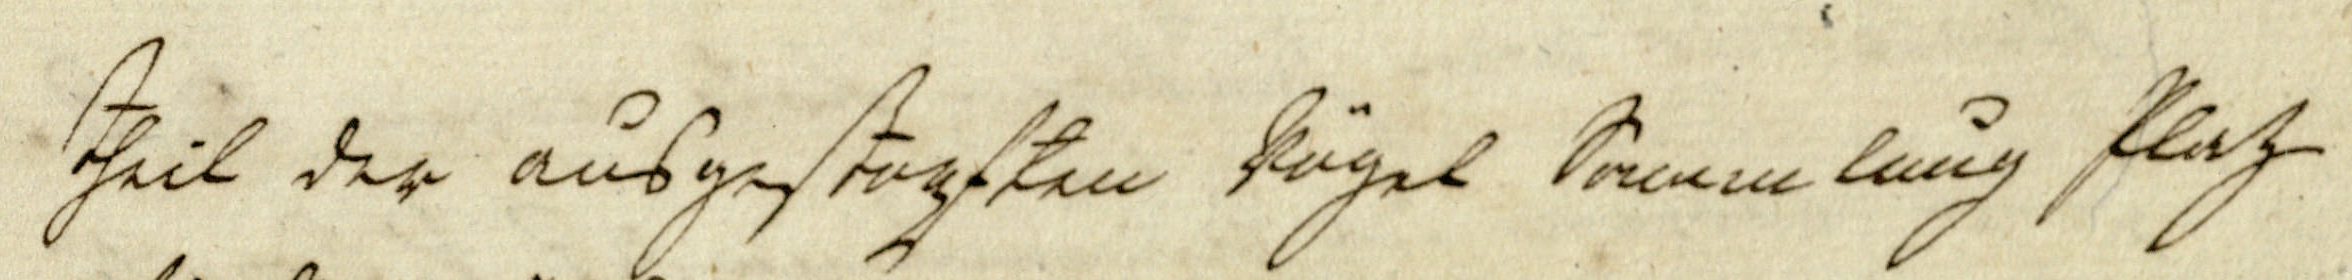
Theil der ausgestopften Vögel Sammlung Platz
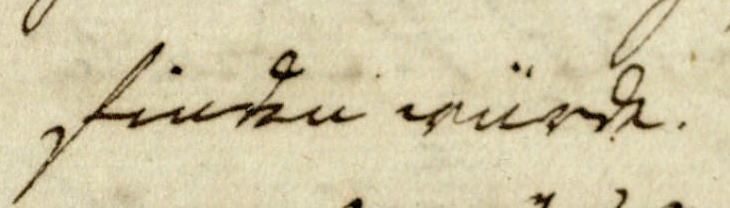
finden würde.
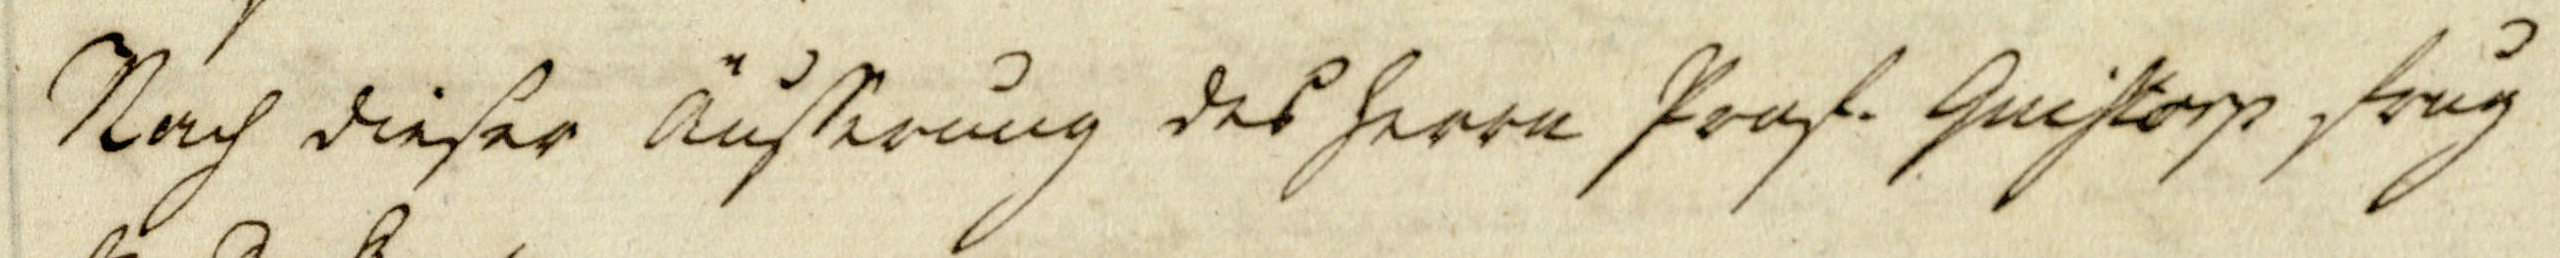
Nach dieser Äusserung des herrn Prof. Quistorp frug
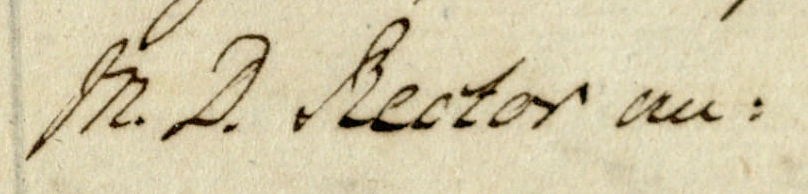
M. D. Rector an:
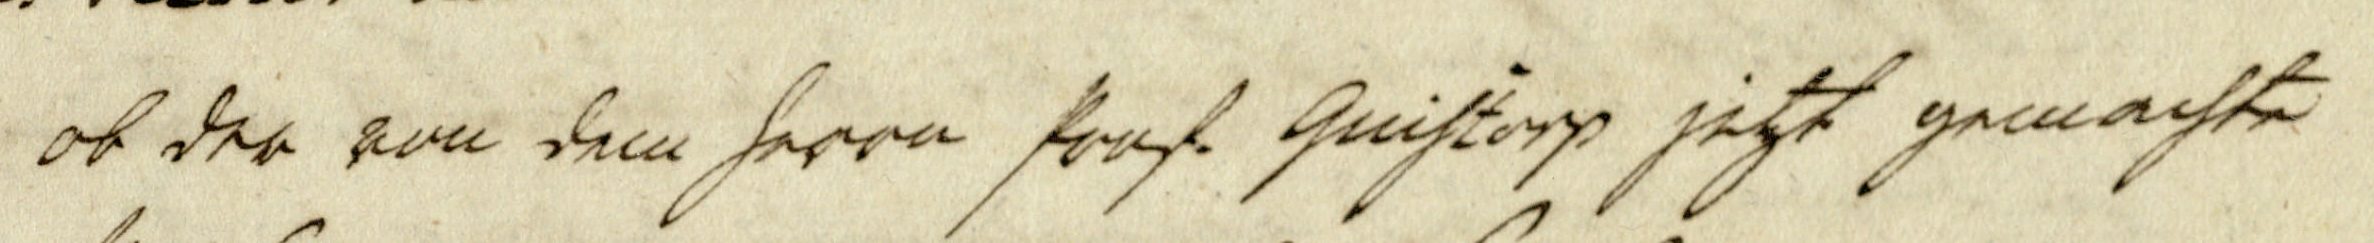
ob der von dem herrn Prof. Quistorp jetzt gemachte
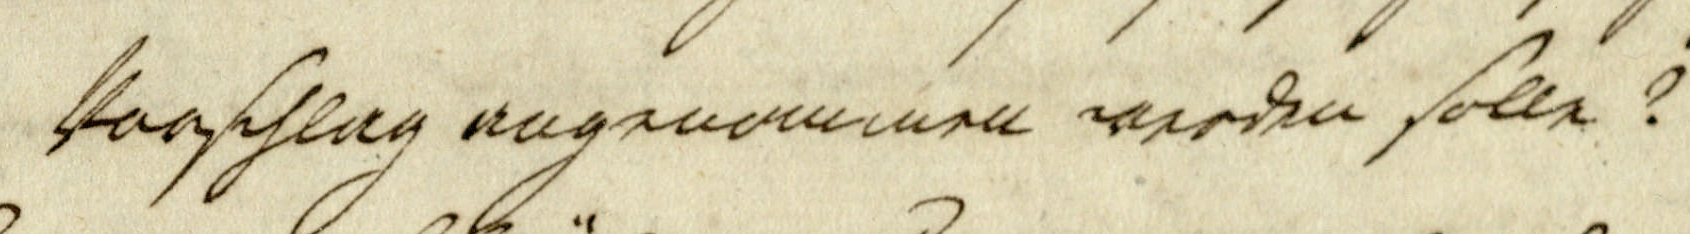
Vorschlag angenommen werden solle?
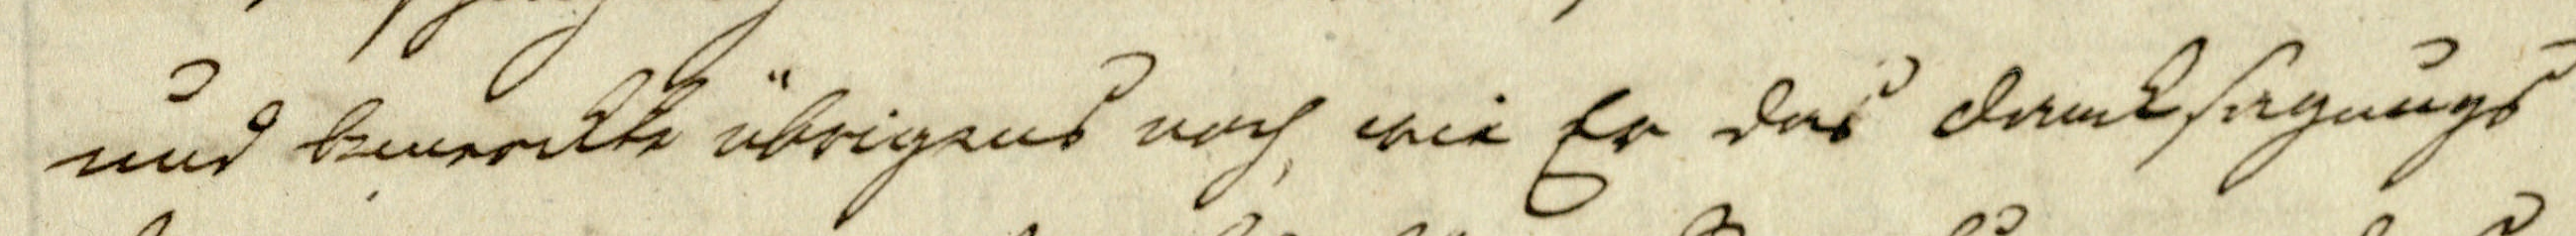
und bemerckte übrigens noch, wie Er das Dancksagungs¬
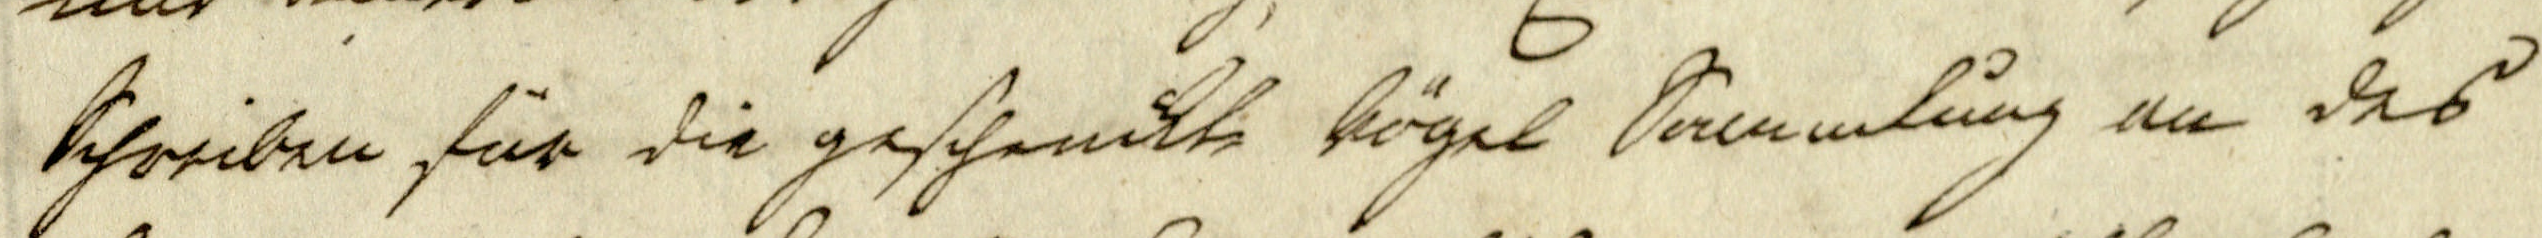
Schreiben für die geschenckte Vögel Sammlung an des
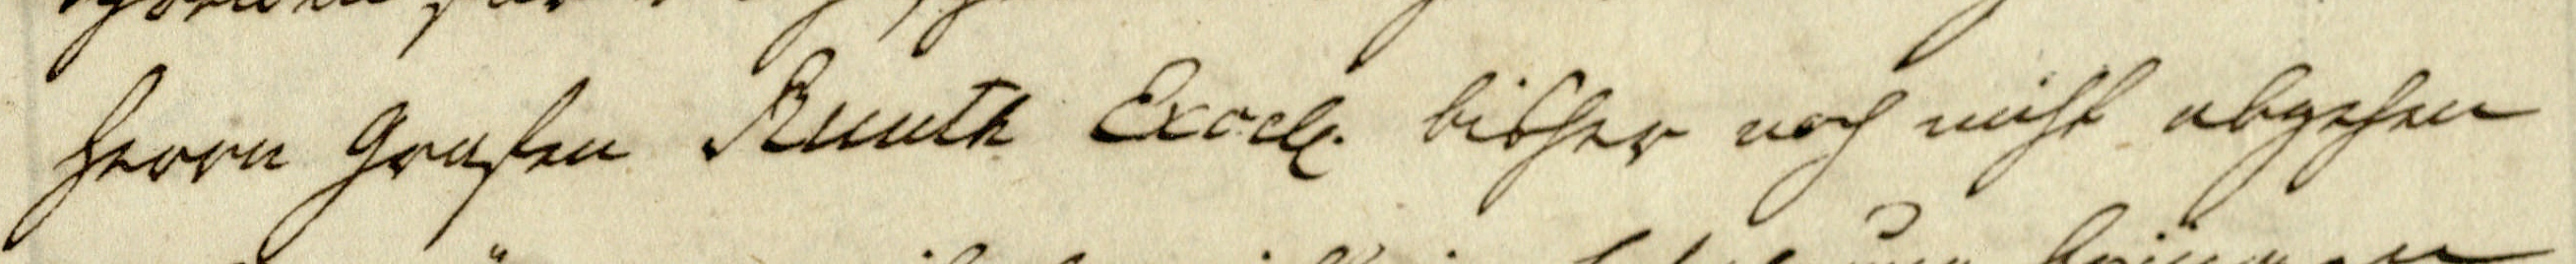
herrn Grafen Ruuth Excel. bisher noch nicht abgehen
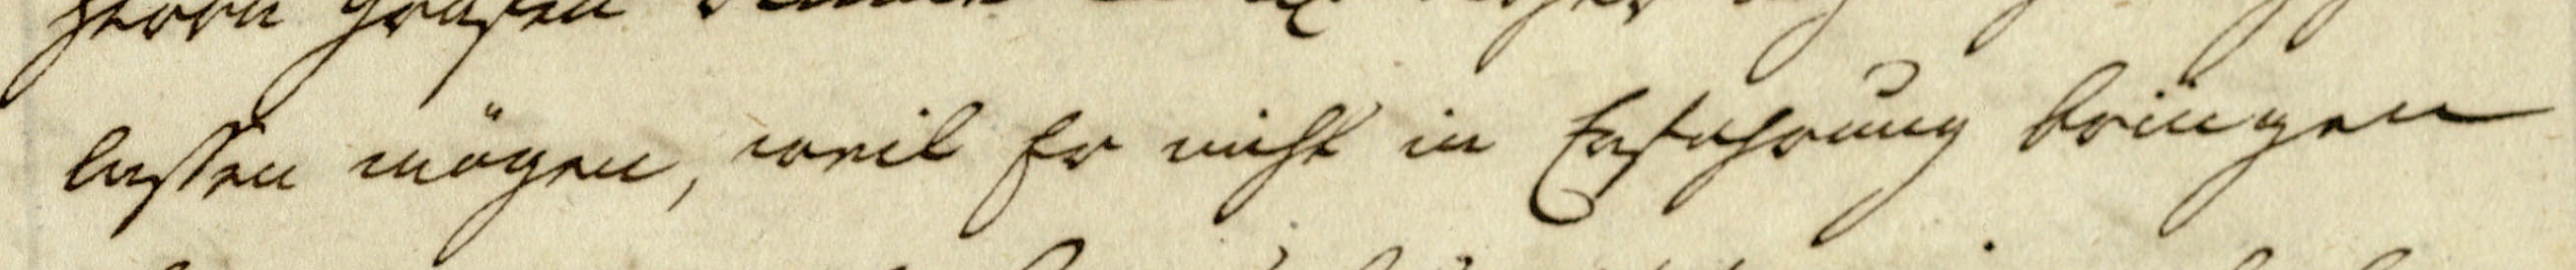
lassen mögen, weil Er nicht in Erfahrung bringen
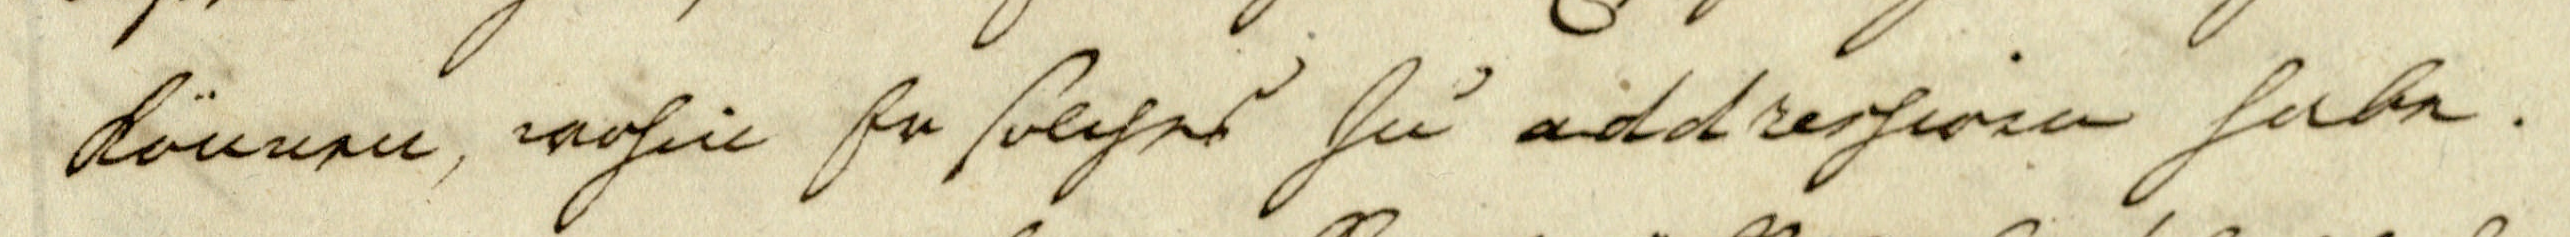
können, wohin Er solches zu addressiren habe.
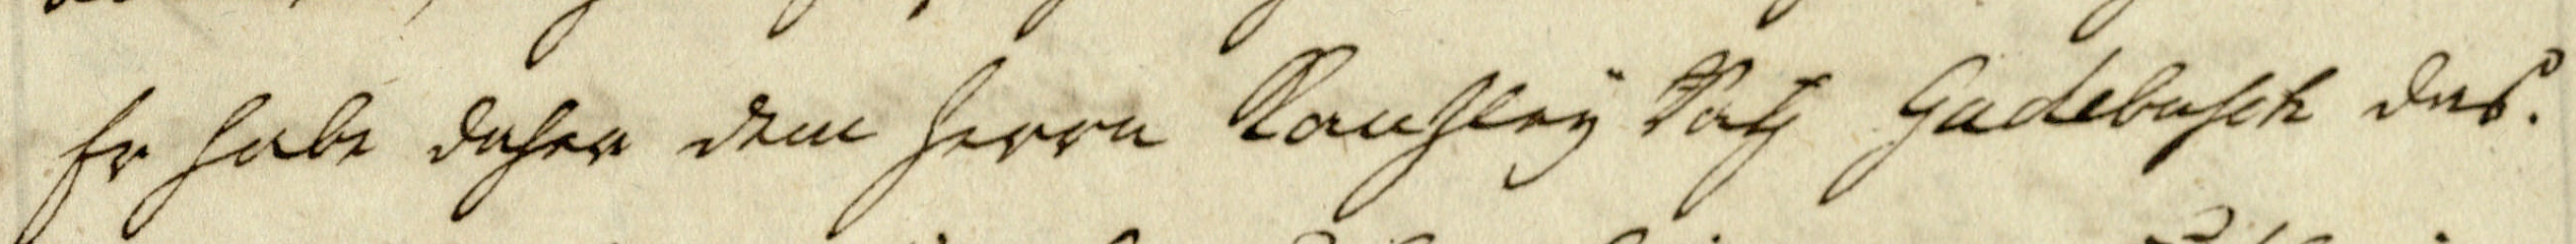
Er habe daher dem herrn Kanzleÿ Rath Gadebusch das¬
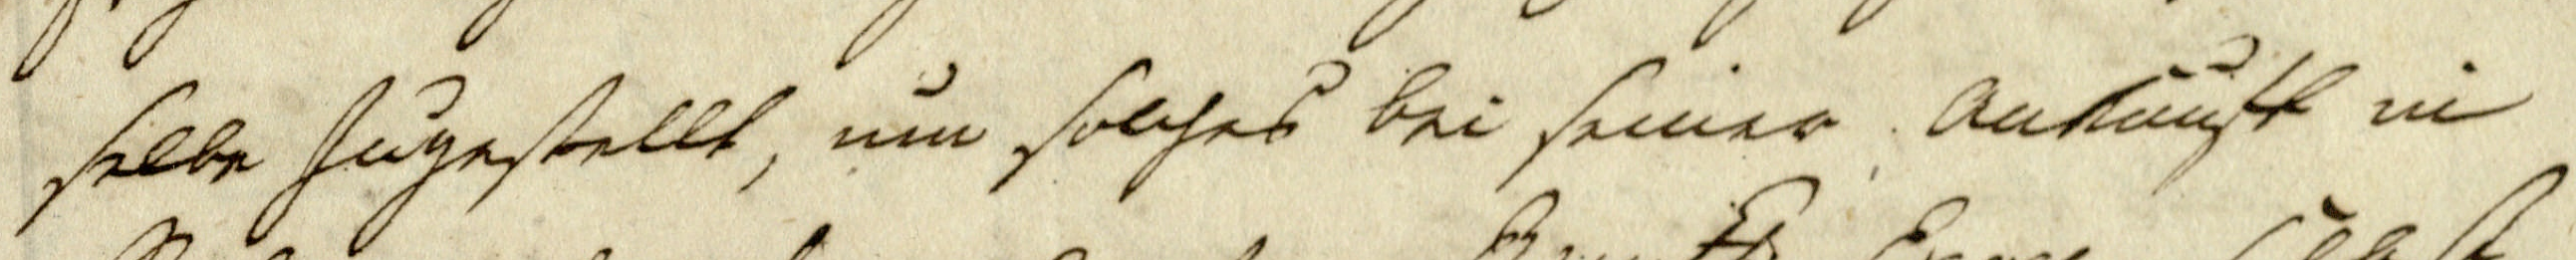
selbe zugestellet, um solches bei seiner Ankunft in
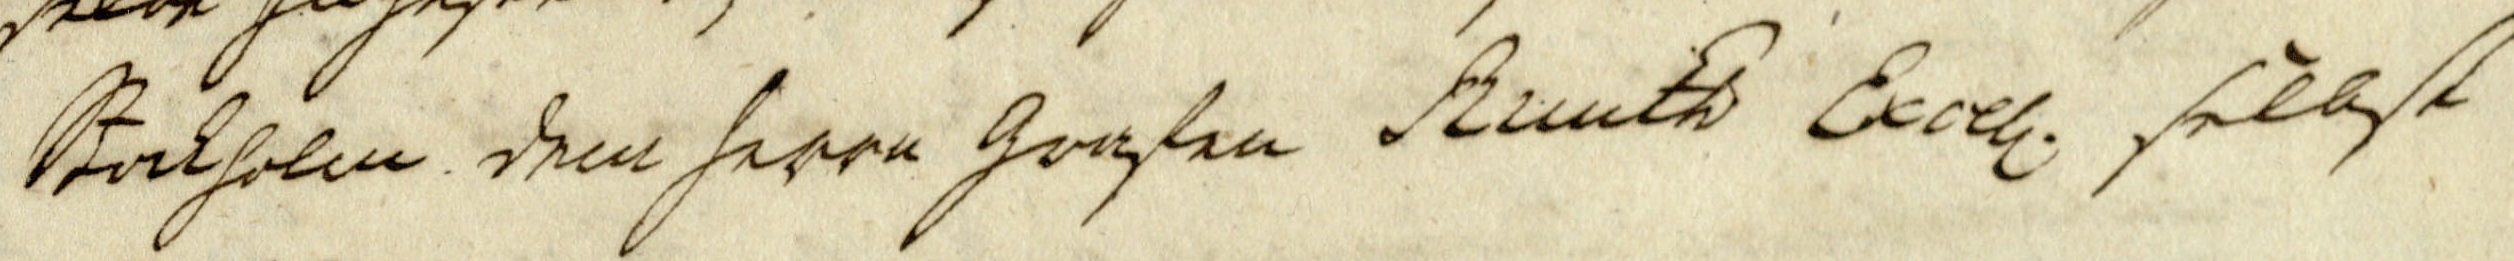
Stockholm dem herrn Grafen Ruuth Excel. selbst
